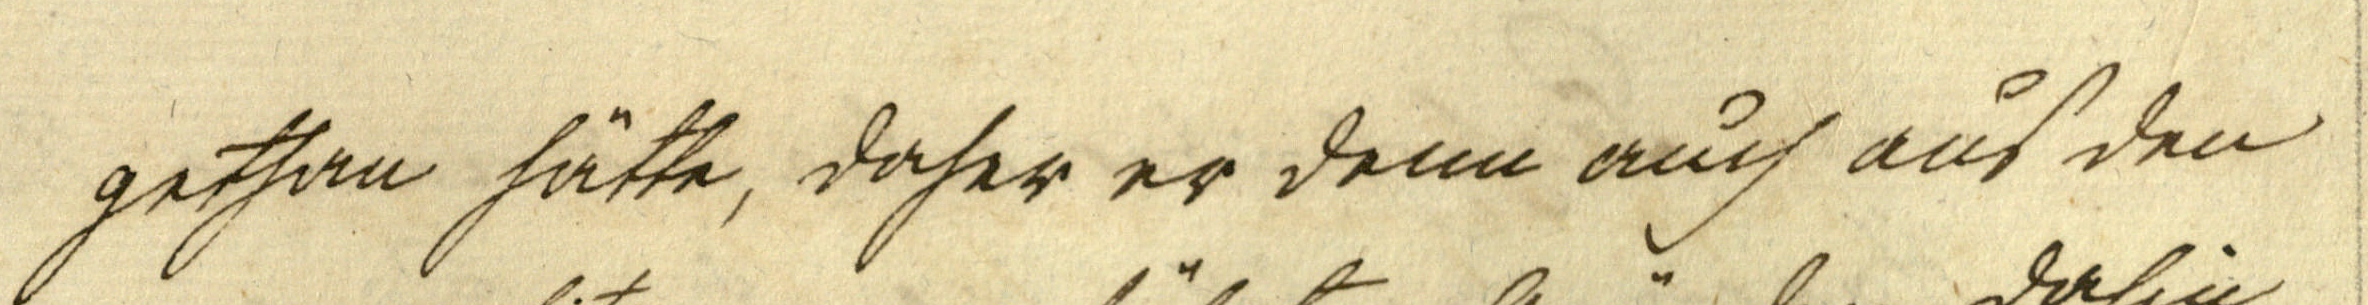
gethan hätte, daher er denn auch aus den
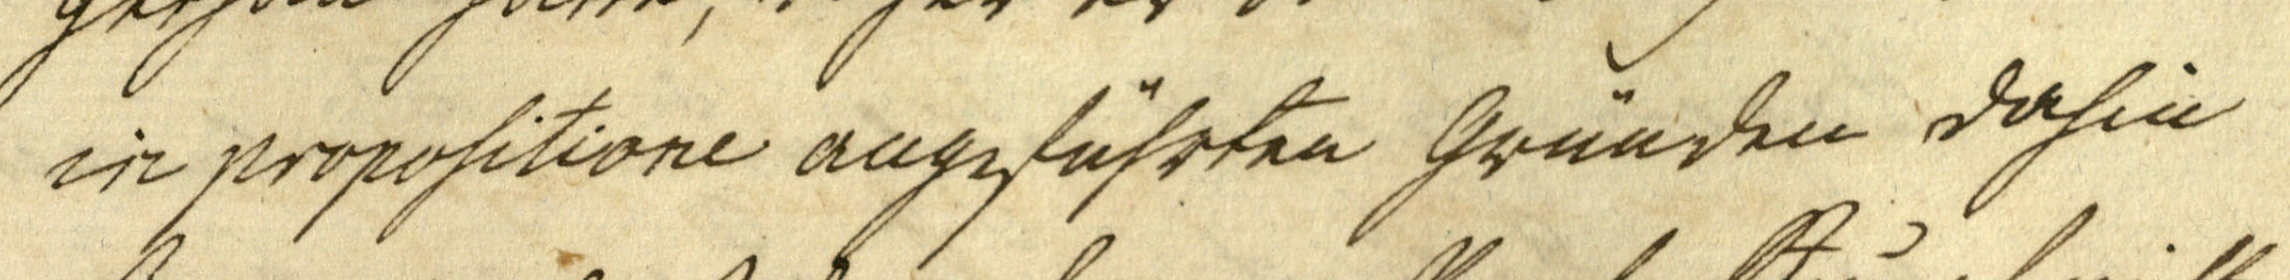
in propositione angeführten Gründen dahin
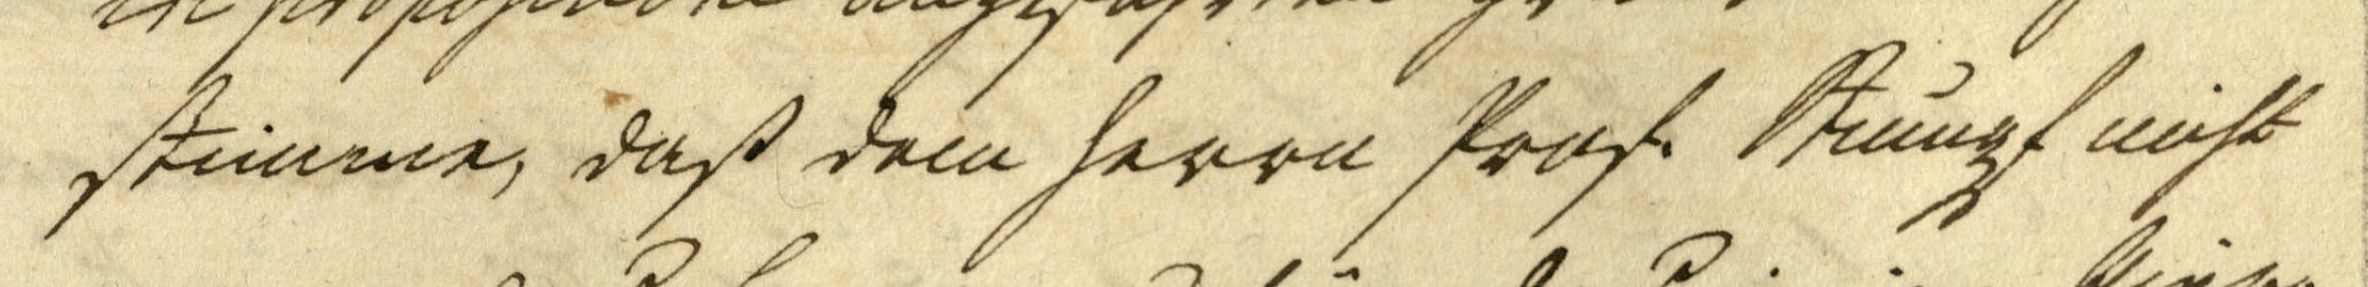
stimme, daß dem Herrn Prof. Stumpf nicht
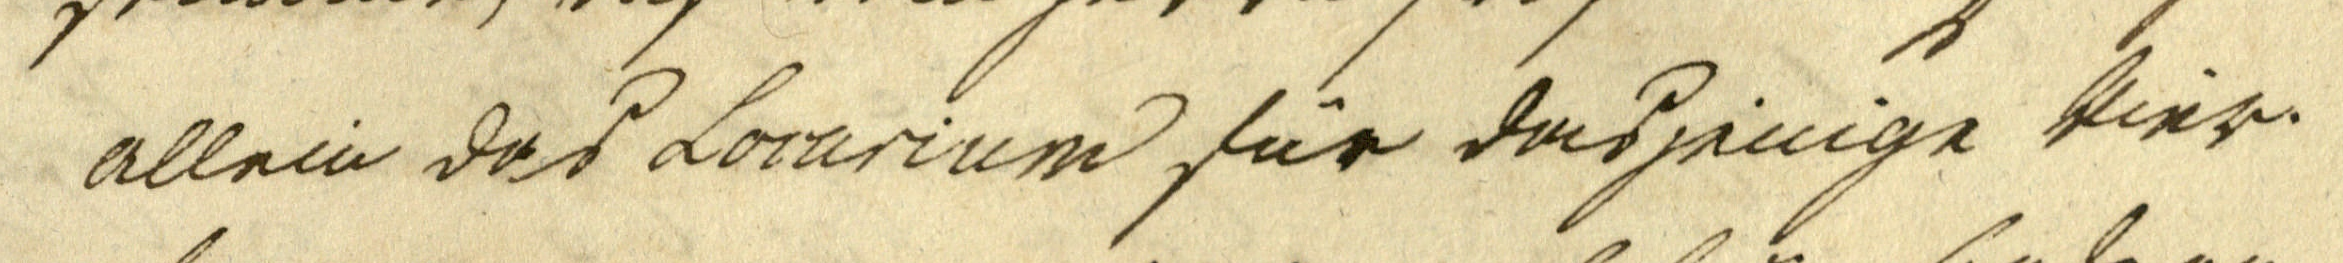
allein das Locarium für dasjenige Vier¬
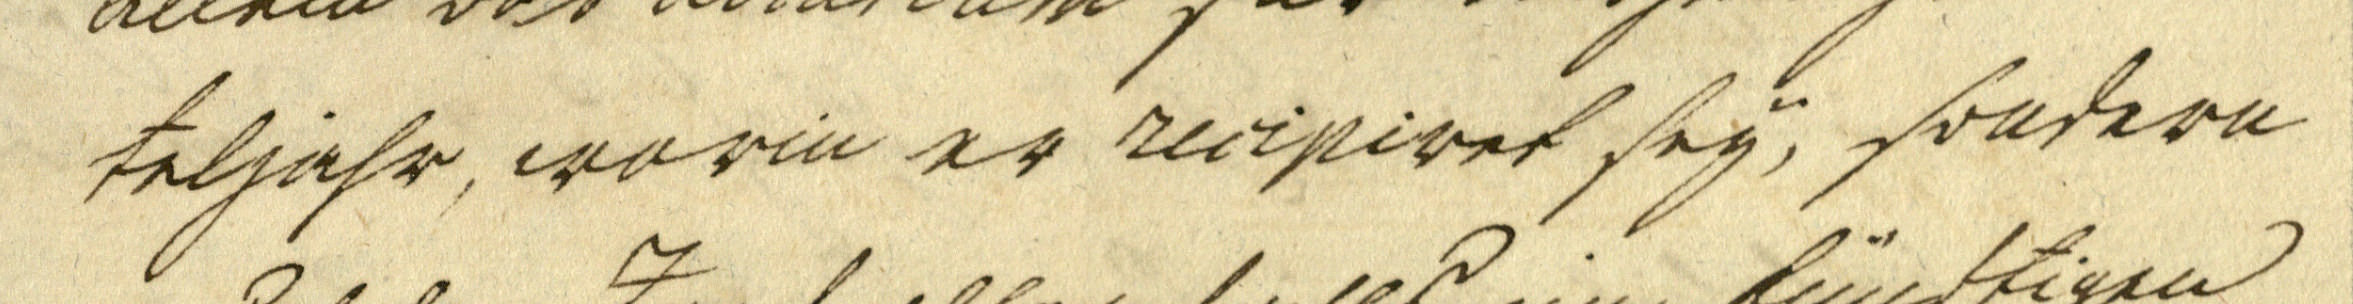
teljahr, worin er recipiret seÿ, sondern
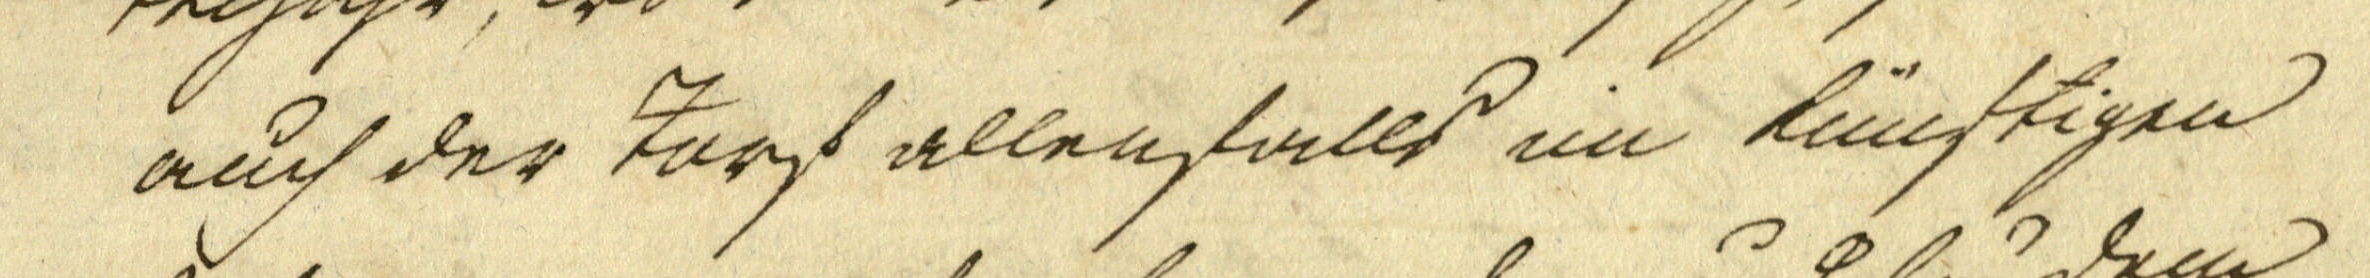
auch der Torf allenfalls im künftigen
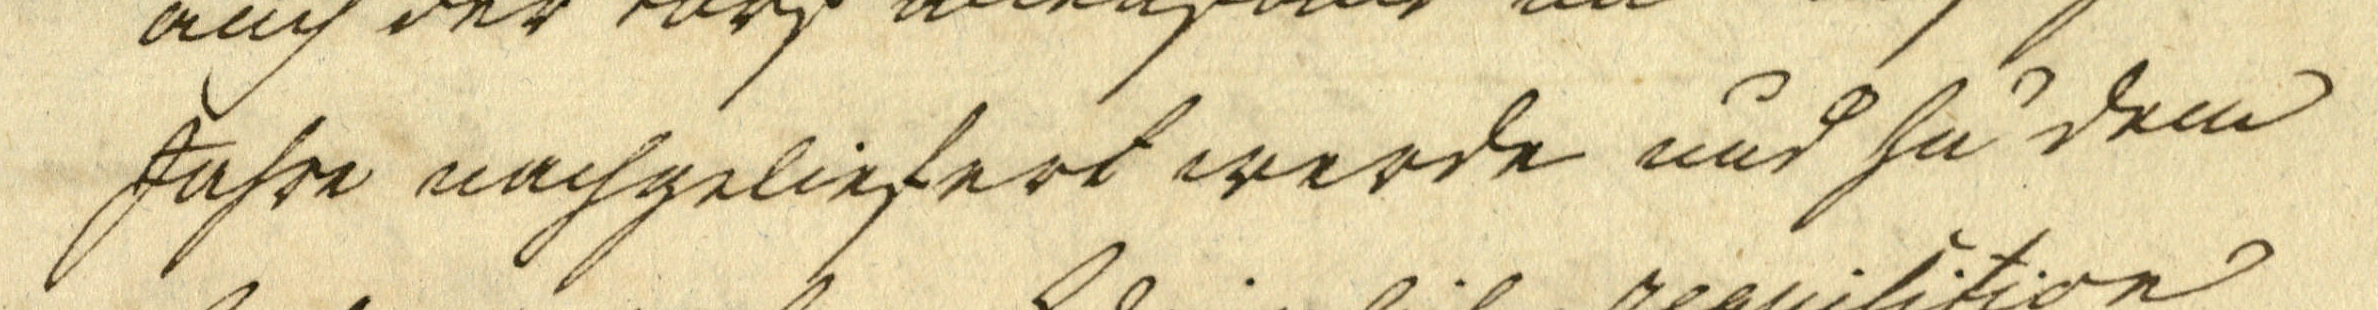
Jahre nachgeliefert werden und zu dem
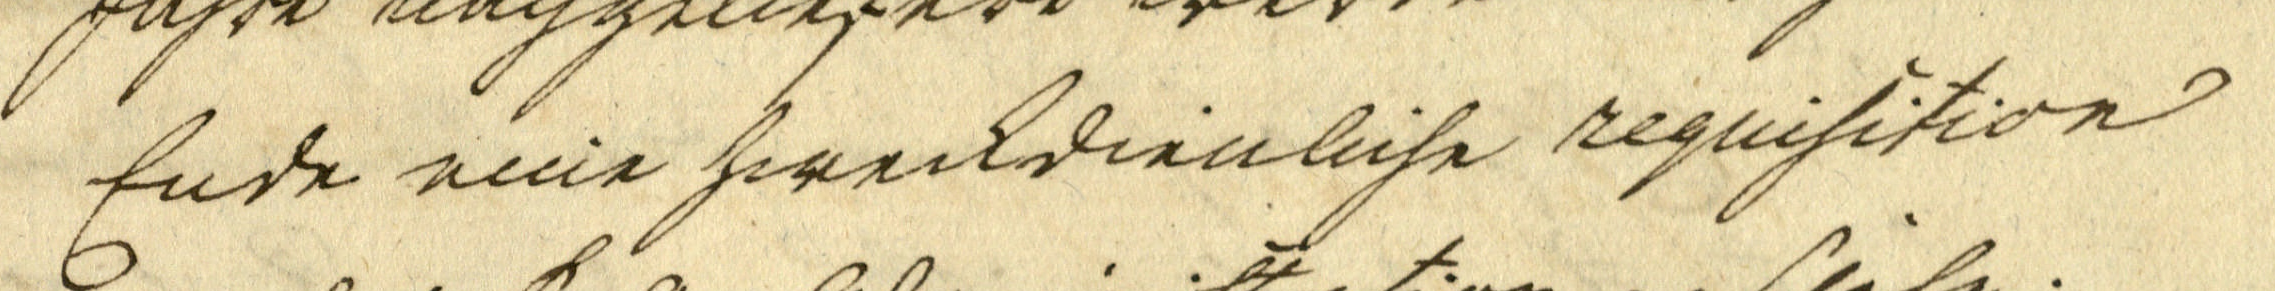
Ende eine zweckdienliche requisition
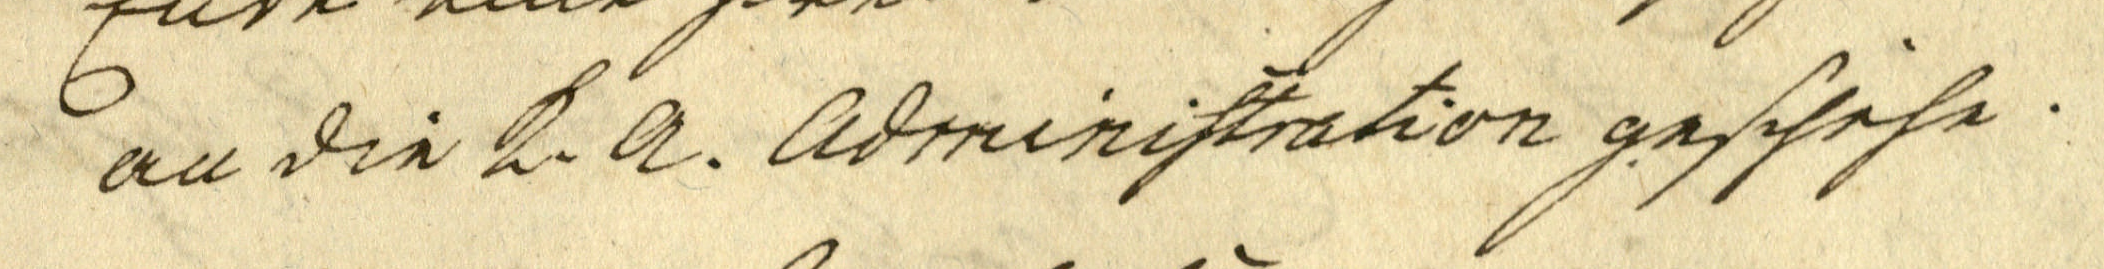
an die K. A. Administration geschehe.
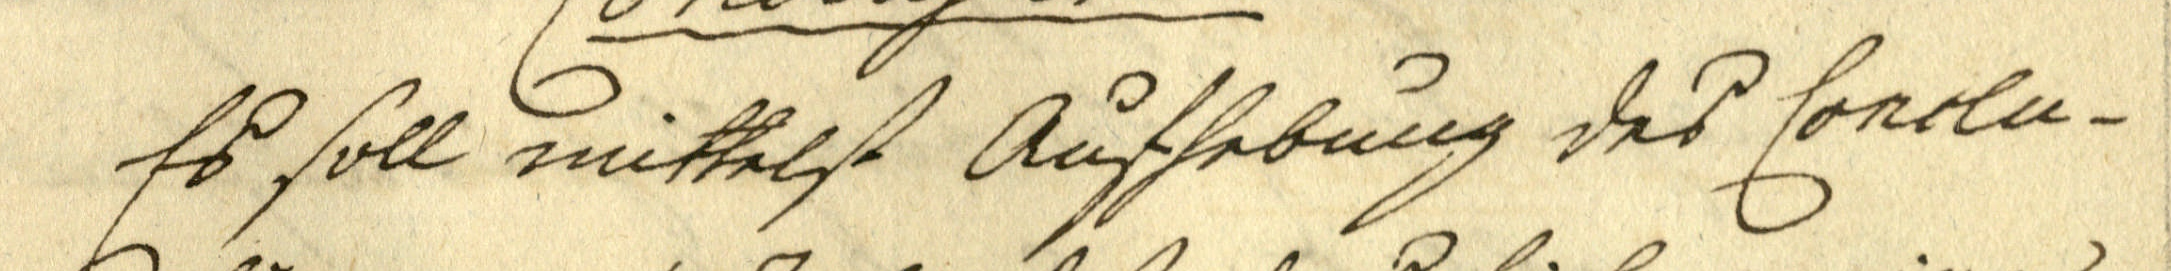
Es soll mittelst Aufhebung des Conclu¬
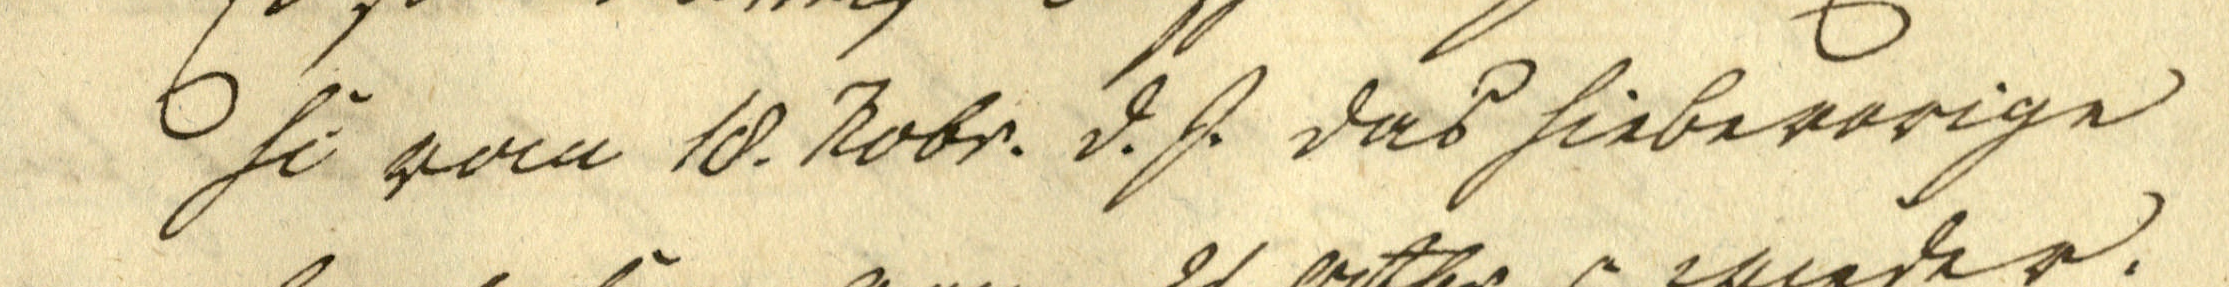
si vom 18. Nobr. d. J. das hiebevorige
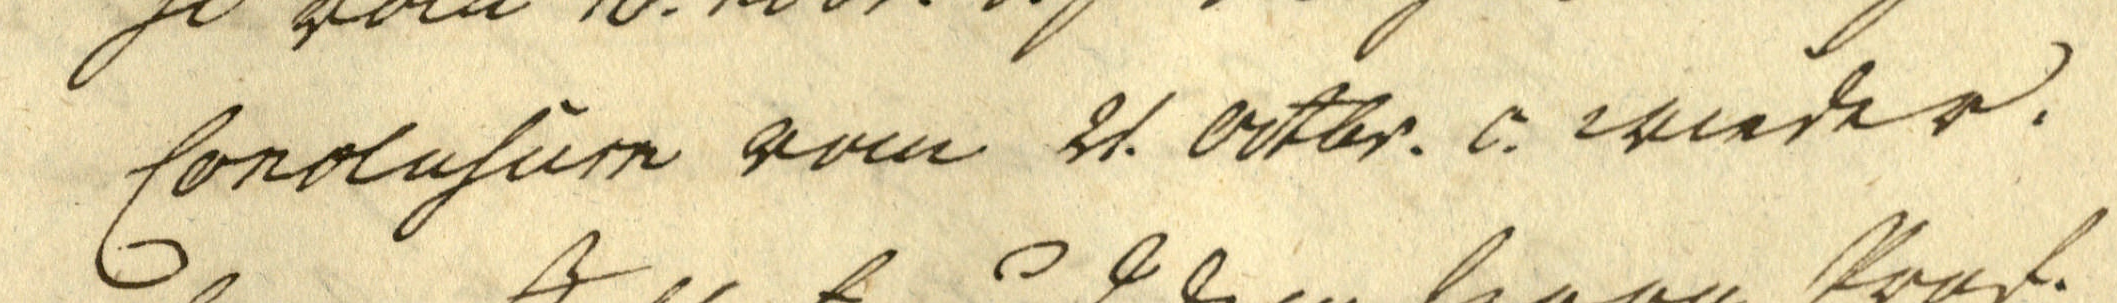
Conclusum vom 21. Octbr. c. wieder¬
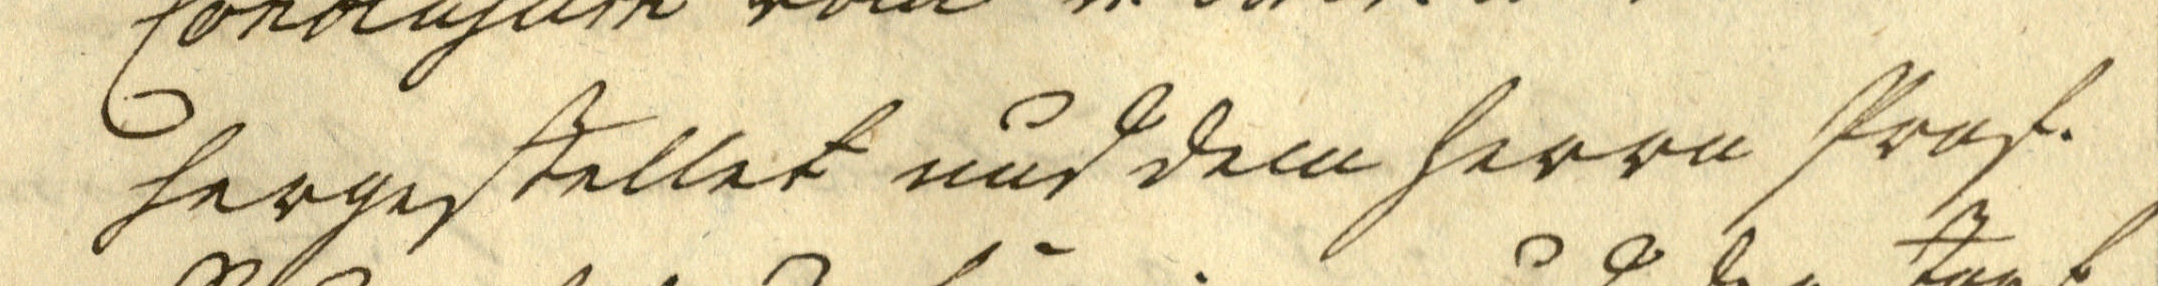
hergestellet und dem Herrn Prof.
